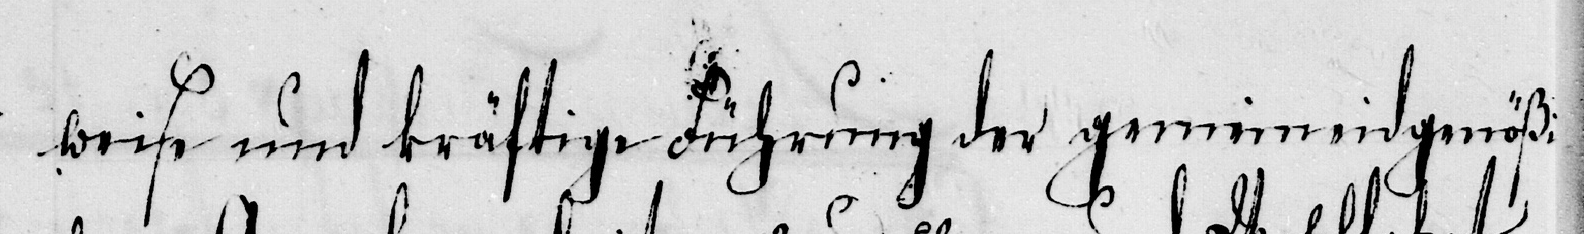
weise und kräftige Führung der gemeineidgenößi¬
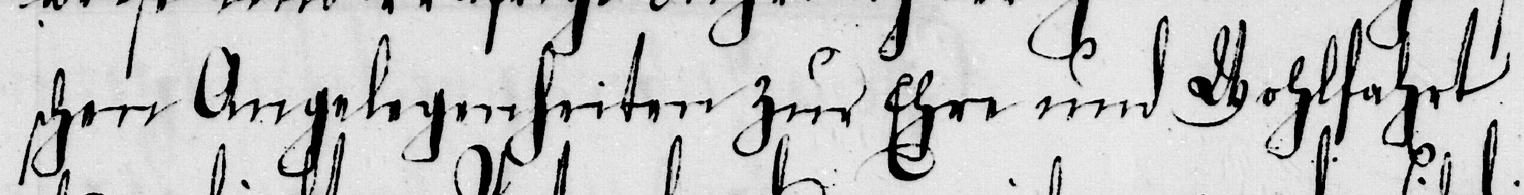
schen Angelegenheiten zur Ehre und Wohlfahrt
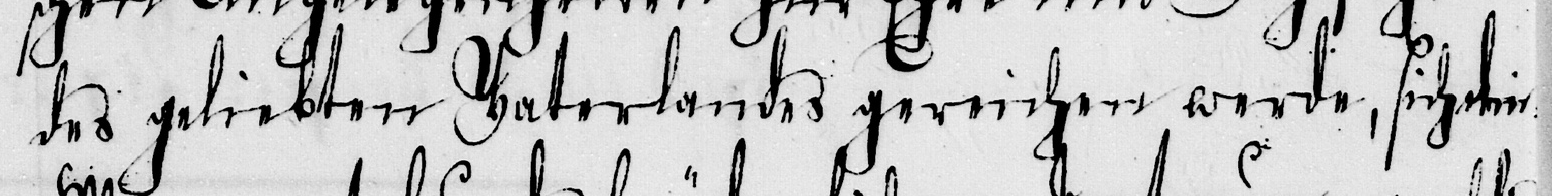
des geliebten Vaterlandes gereichen werde, sich de¬
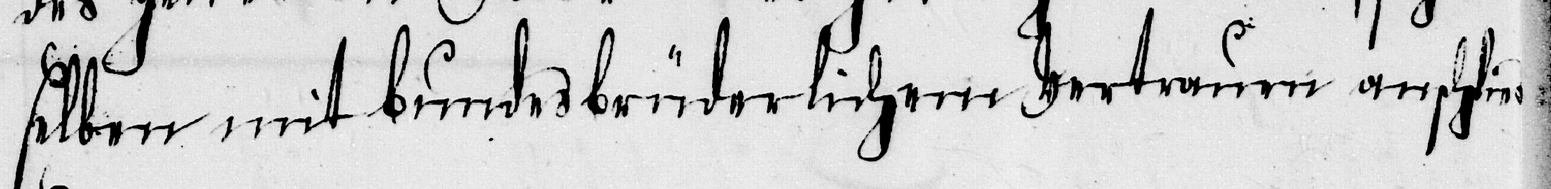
selben mit bundesbrüderlichem Vertrauen anschlie¬
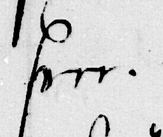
sen.
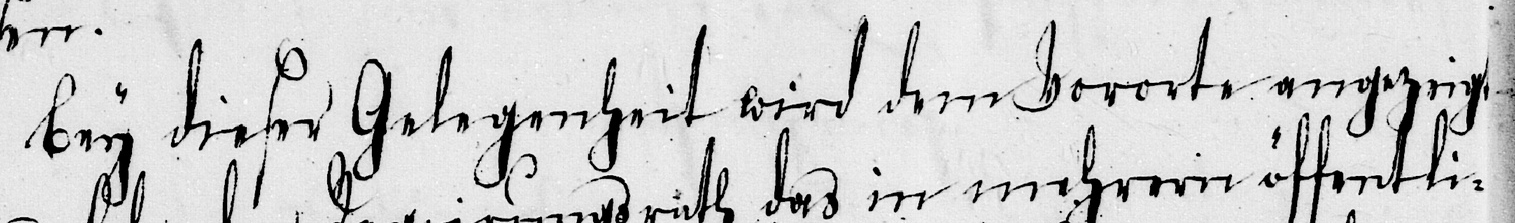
Bey dieser Gelegenheit wird dem Vororte angezeigt
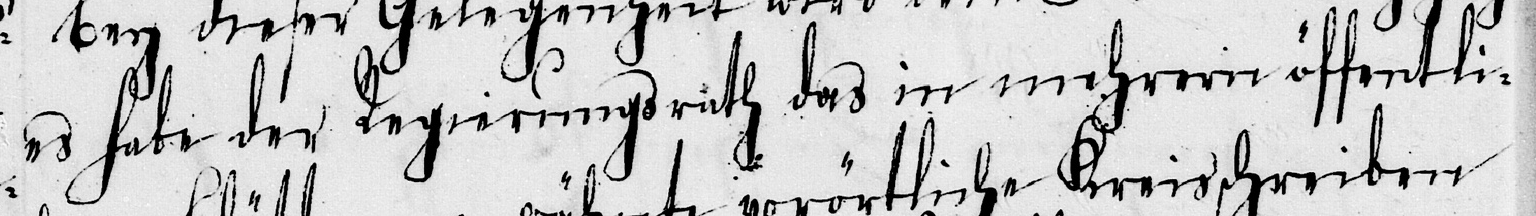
es habe der Regierungsrath das in mehrern öffentli¬
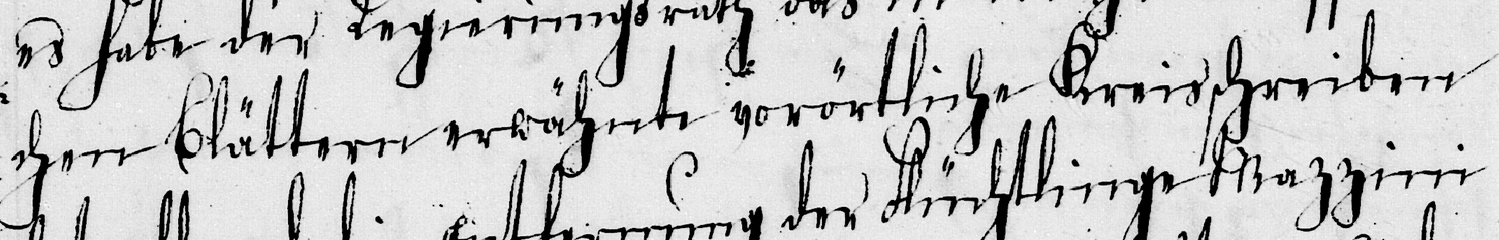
chen Blättern erwähnte vorörtliche Kreisschreiben
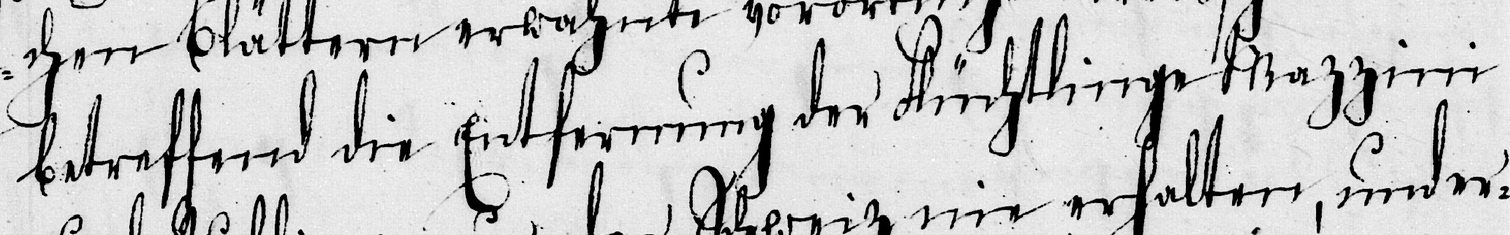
betreffend die Entfernung der Flüchtlinge Mazzini
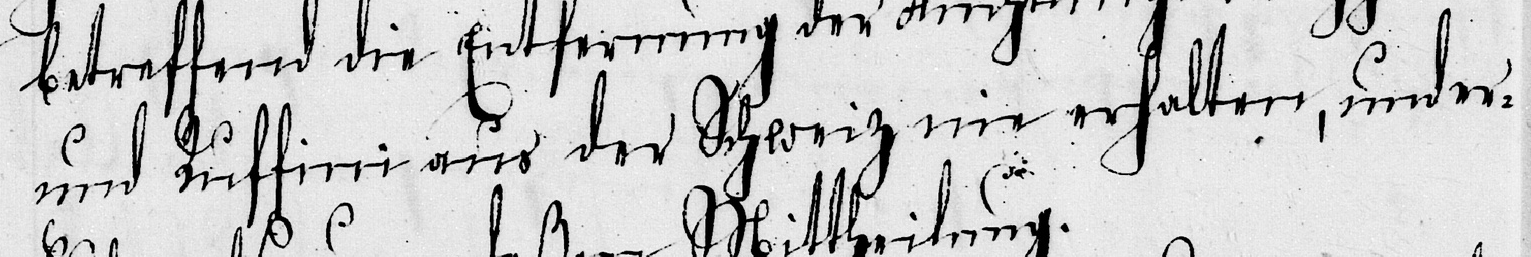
und Ruffini aus der Schweiz nie erhalten, und er¬
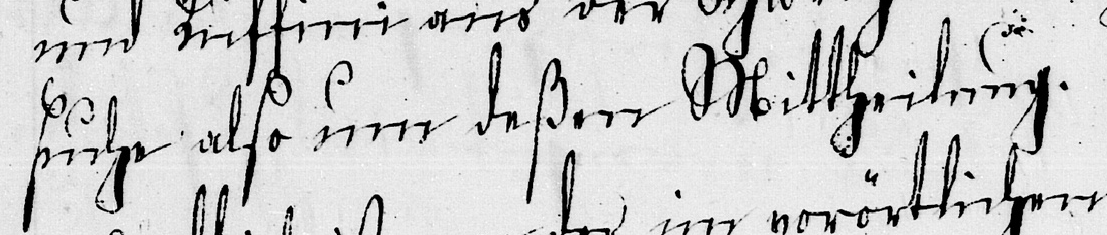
suche also um deßen Mittheilung.
